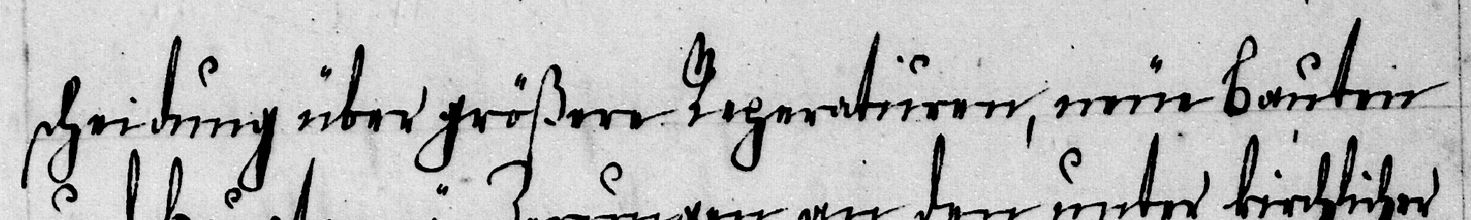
scheidung über größere Reparaturen, neue Bauten
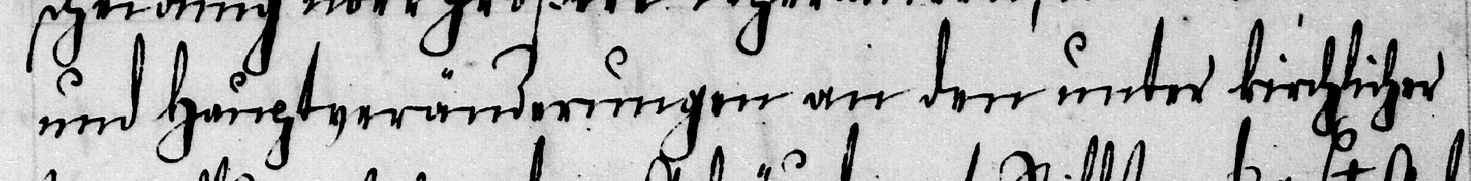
und Hauptveränderungen an den unter kirchlicher
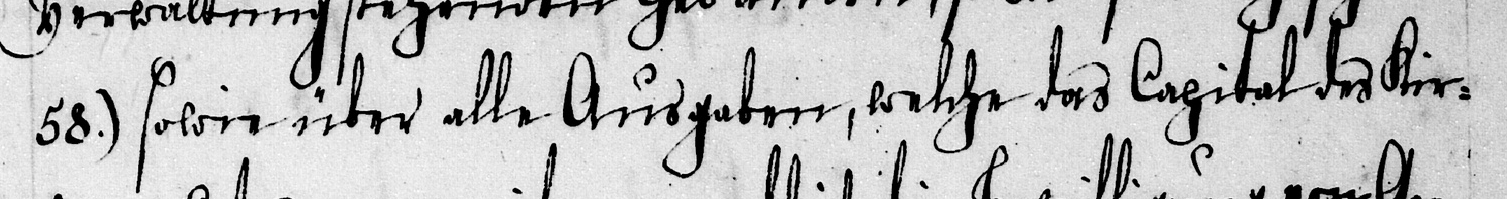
58.] sowie über alle Ausgaben, welche das Capital des Kir¬
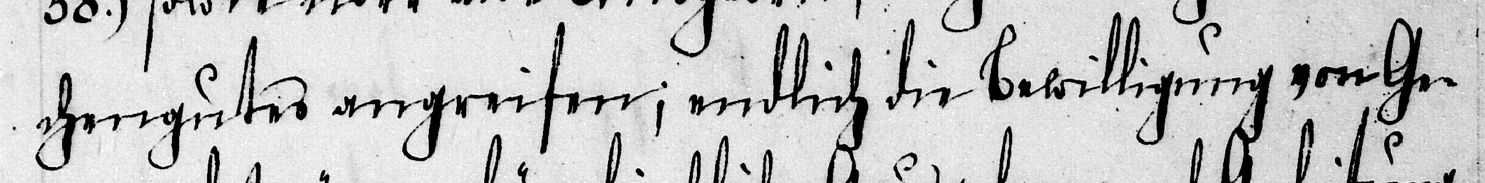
chengutes angreifen; endlich die Bewilligung von Ge¬
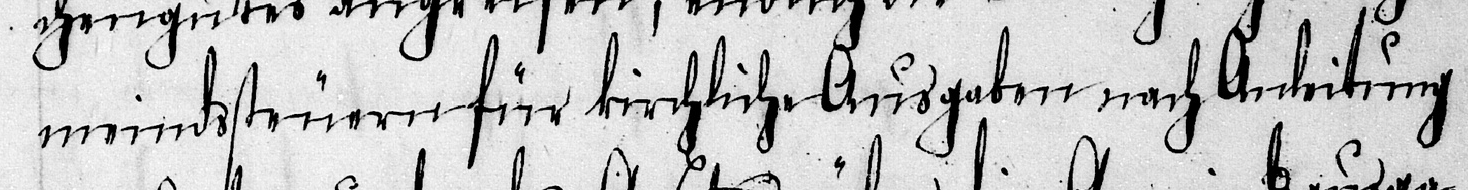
meindssteuern für kirchliche Ausgaben nach Anleitung
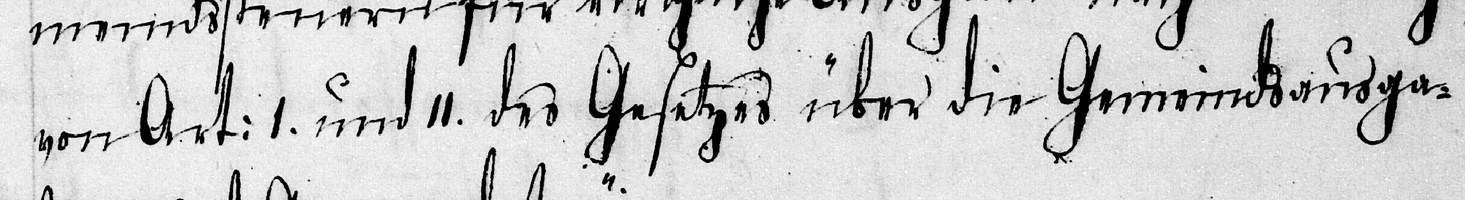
von Art. 1. des Gesetzes über die Gemeindsausga¬
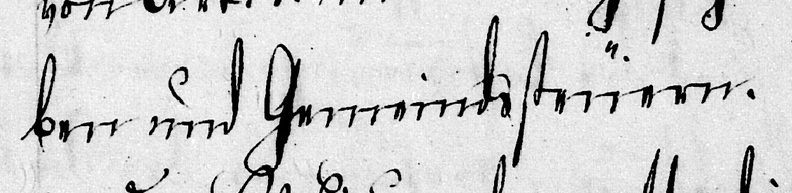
ben und Gemeindssteuern.
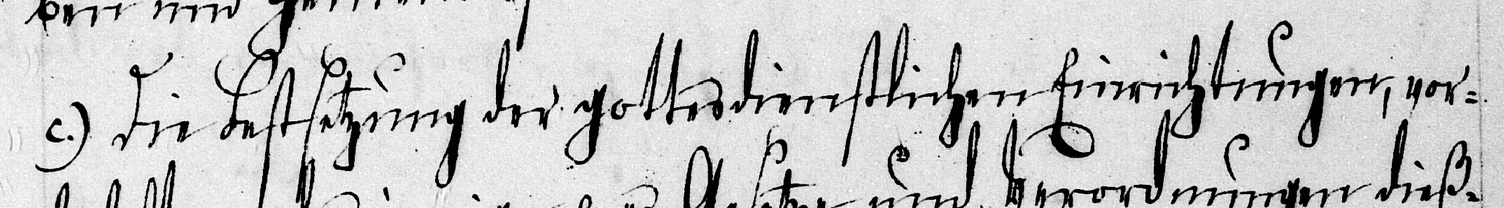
c.) Die Festsetzung der gottesdienstlichen Einrichtungen, vor¬
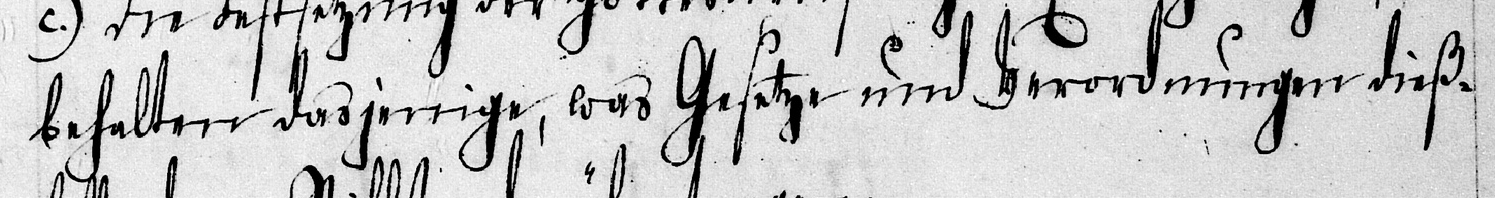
behalten dasjenige, was Gesetze und Verordnungen dieß¬
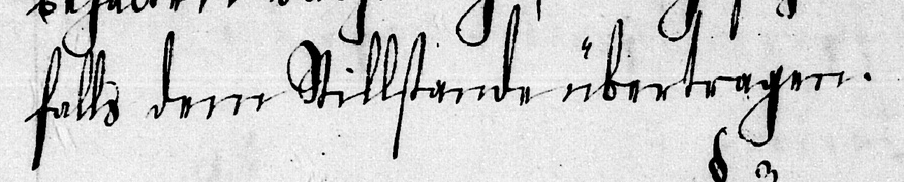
falls dem Stillstande übertragen.
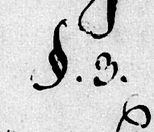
§. 3.
